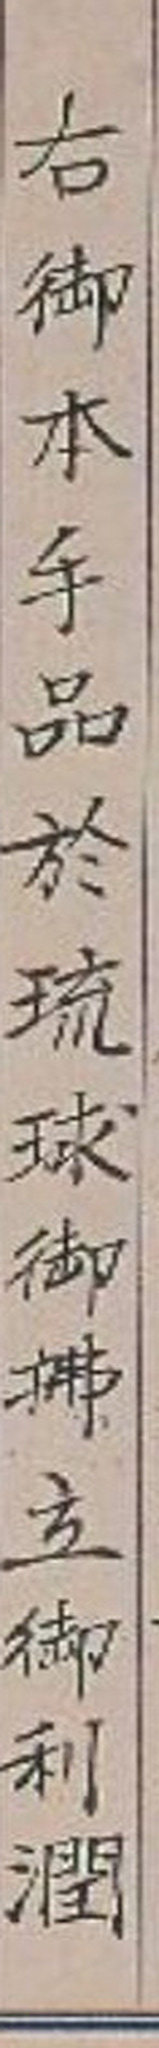右御本手品於琉球御拂立御利潤
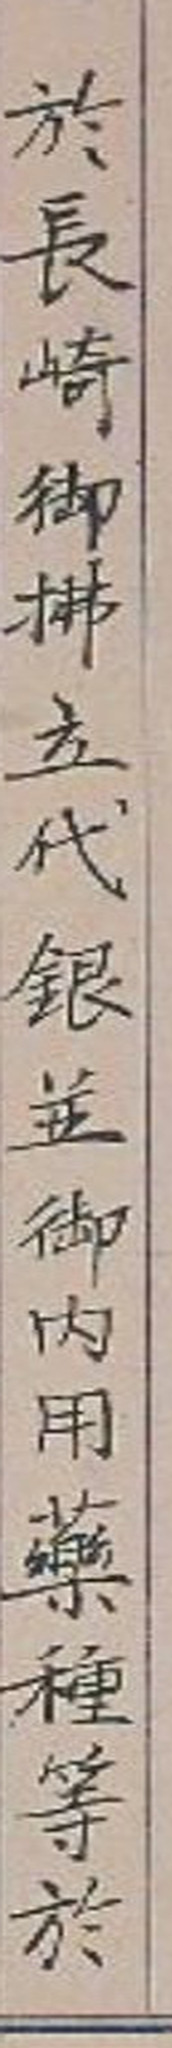於長崎御拂立銀並御内用薬種等於
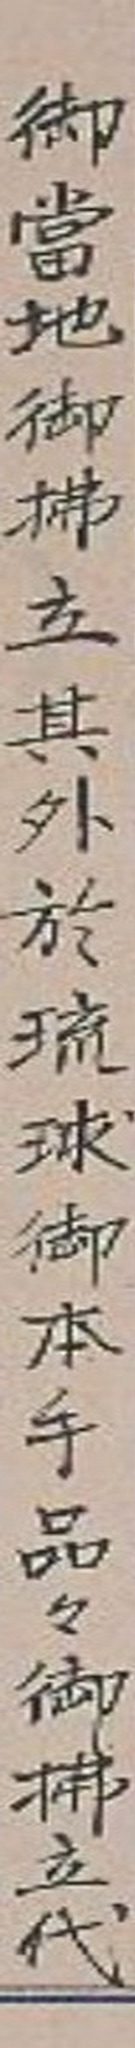御當地御拂代其外於琉球御本手品々御拂立代
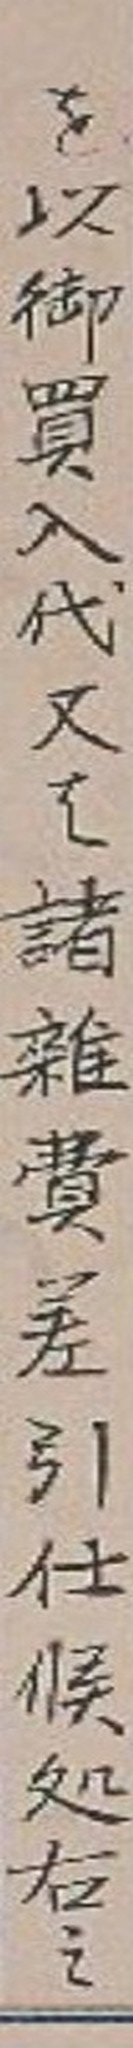を以御買入代又は者諸雜費差引仕候処右之
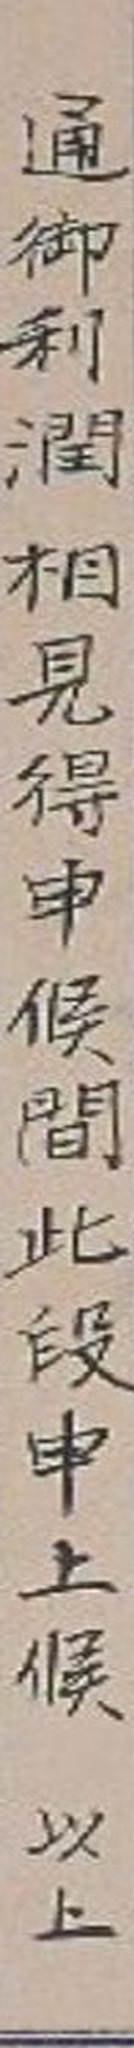通御利潤相見得申候間此段申上候以上
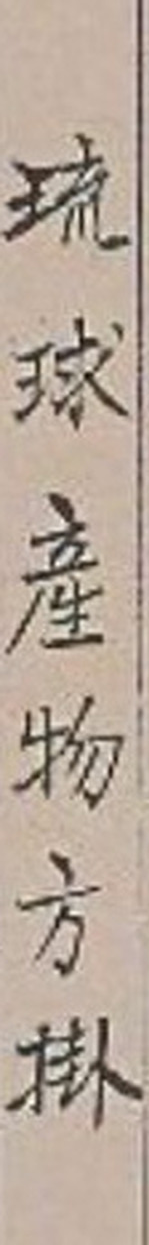琉球産物方掛
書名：琉球産物於長崎拂立並本手品利潤総帖 弘化四年より酉年迄
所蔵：University of the Ryukyus Library
